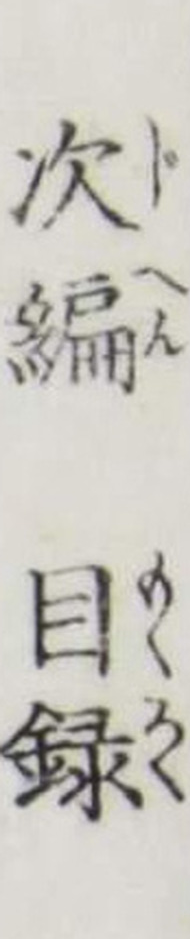次編目録
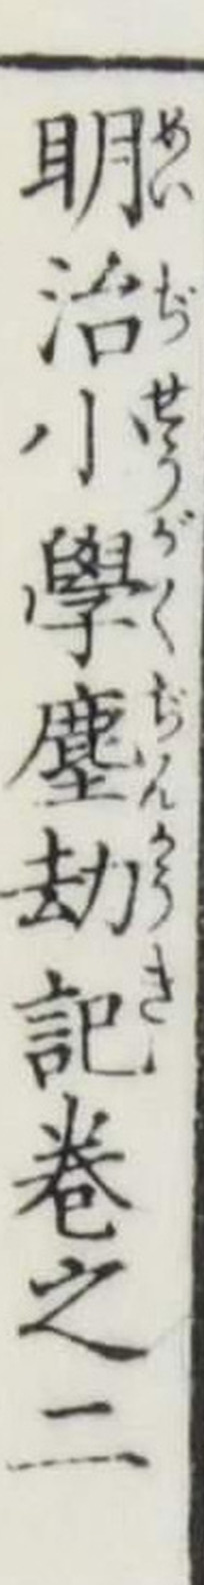明治小学塵劫記巻之二
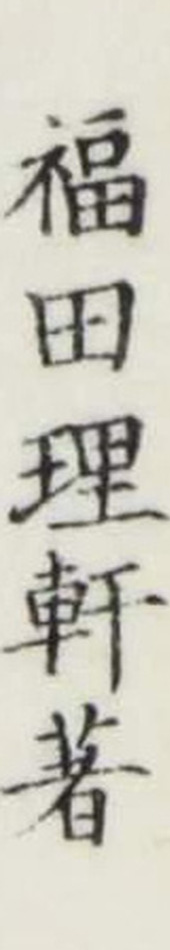福田理軒著
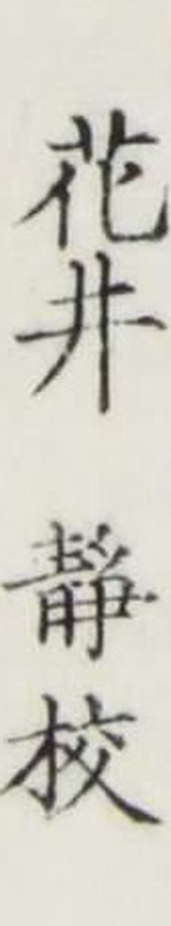花井静校
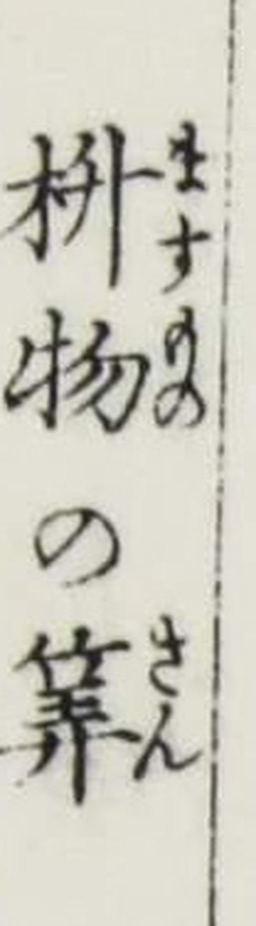枡物の算
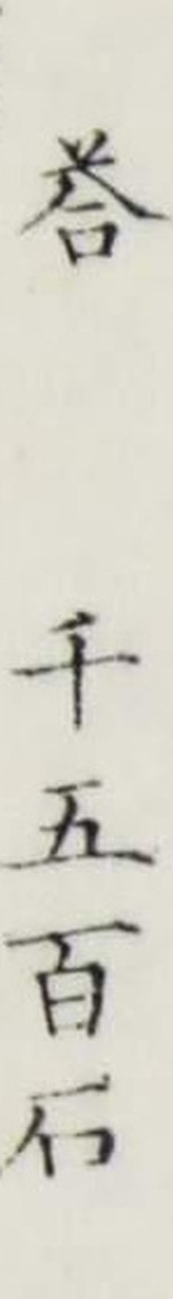答千五百石
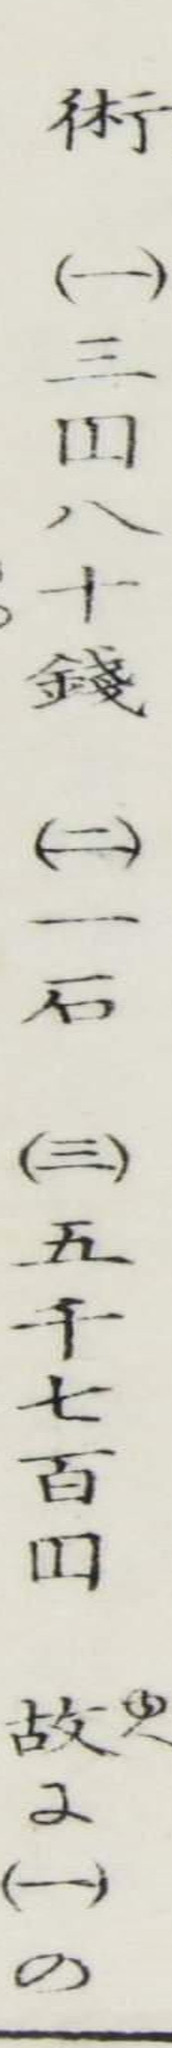術㈠三円八十銭㈡一石㈢五千七百円故に㈠の
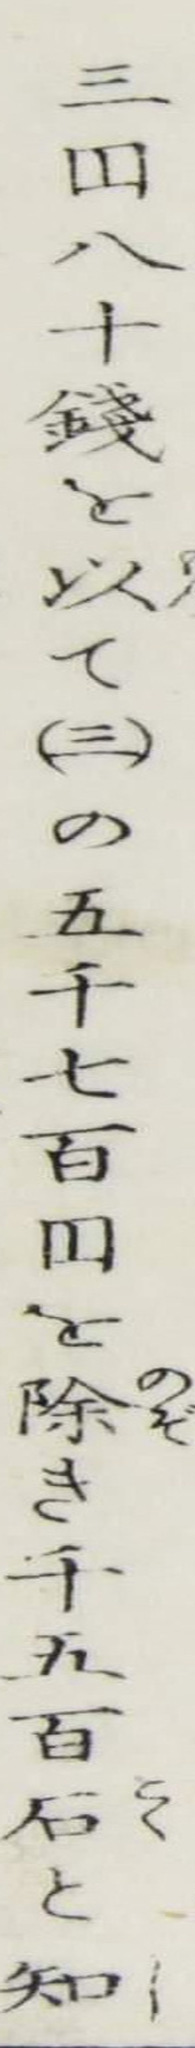三円八十銭を以て㈢の五千七百円を除き千五百石と知
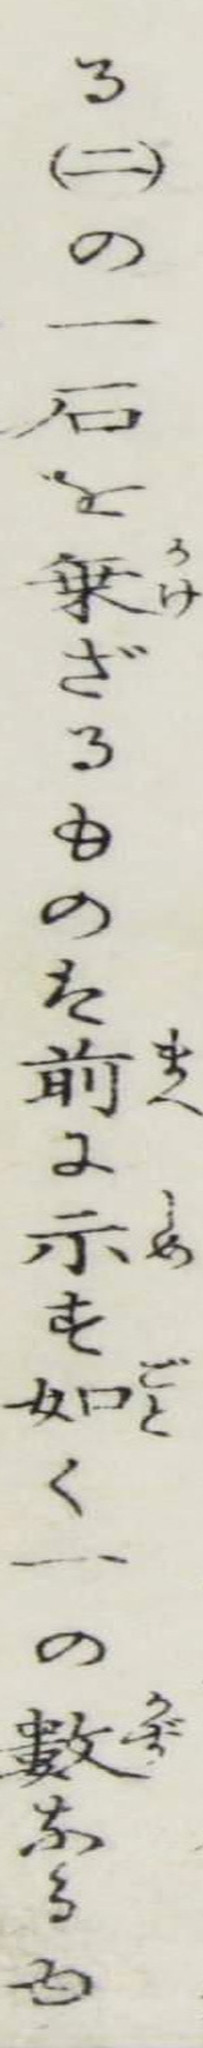る㈡の一石を乗ざるものは前に示す如く一の数なるゆ
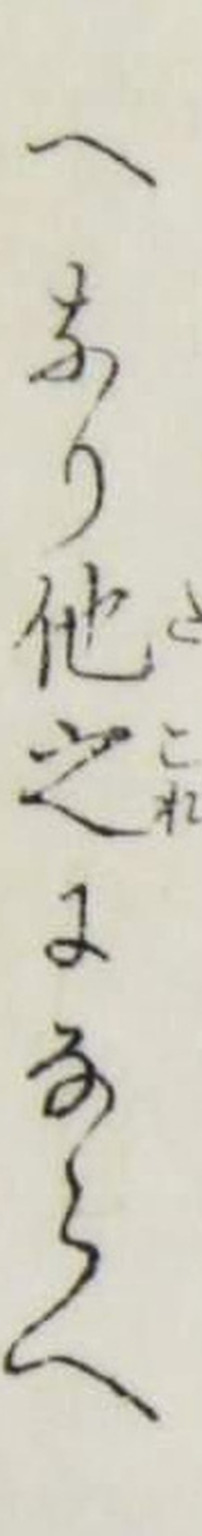へなり他之にならへ
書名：明治小學塵劫記 卷2
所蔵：東京学芸大学教育コンテンツアーカイブ
